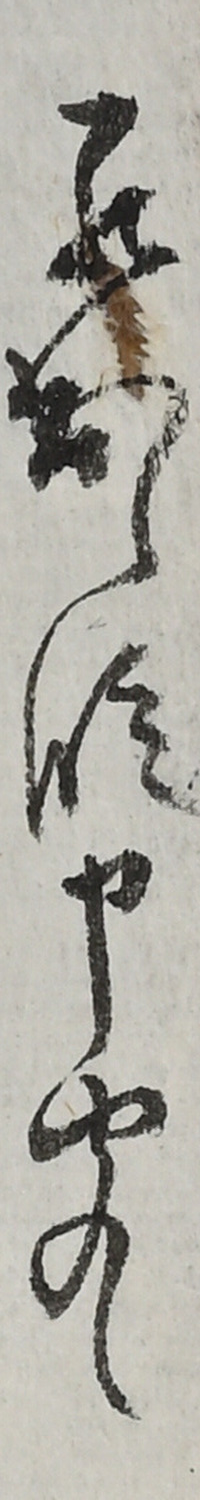罷出候段申聞候
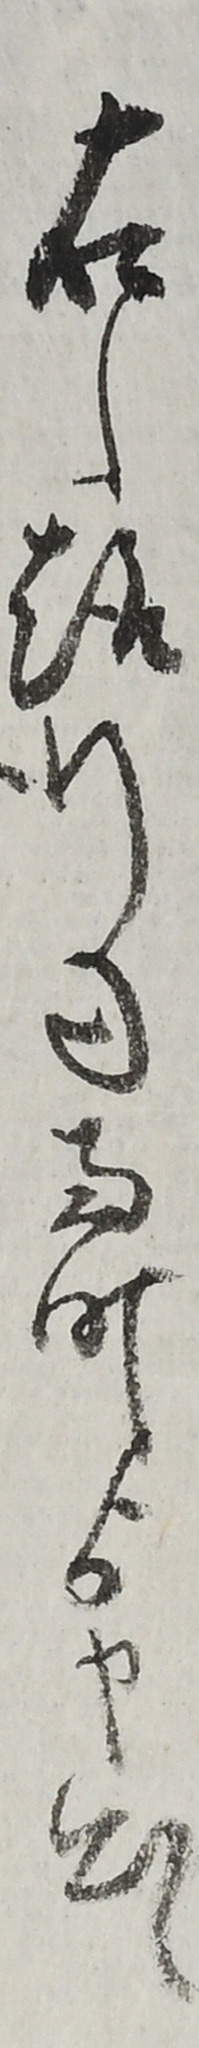右之趣行司両町ゟ申出候
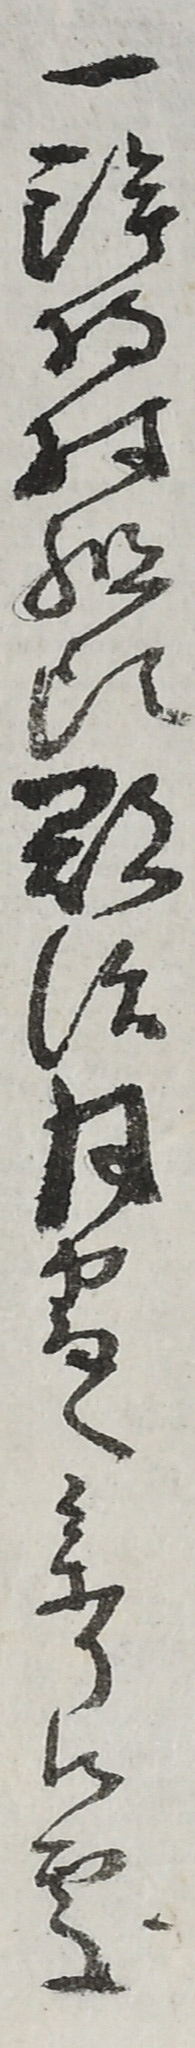一鉾持村組頭郡治月番へ参り候処
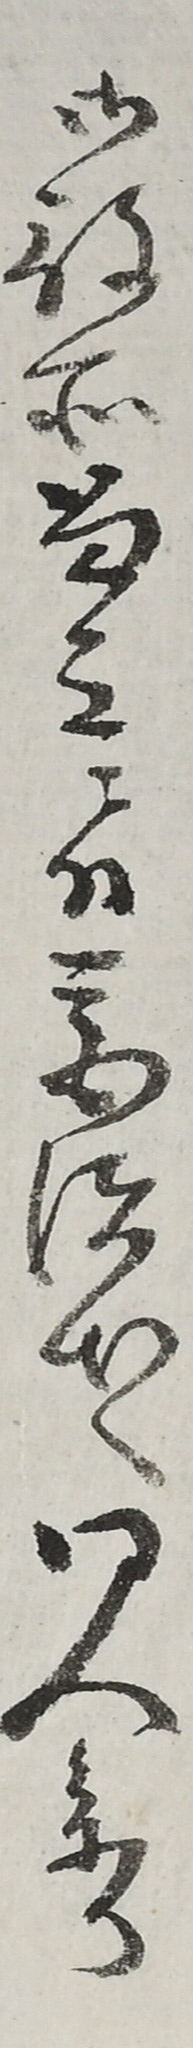御役所留主ニ付宮治氏へ同人参り
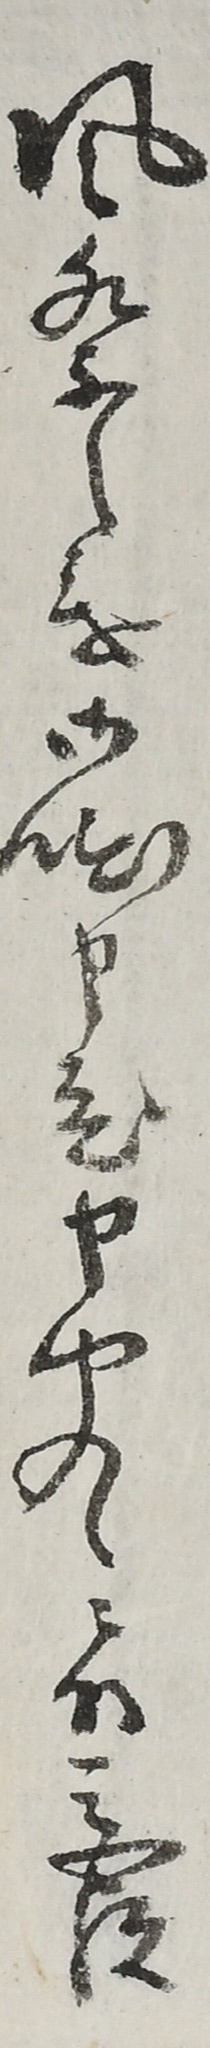風祭之義御咄申心申聞候ニ付宮治
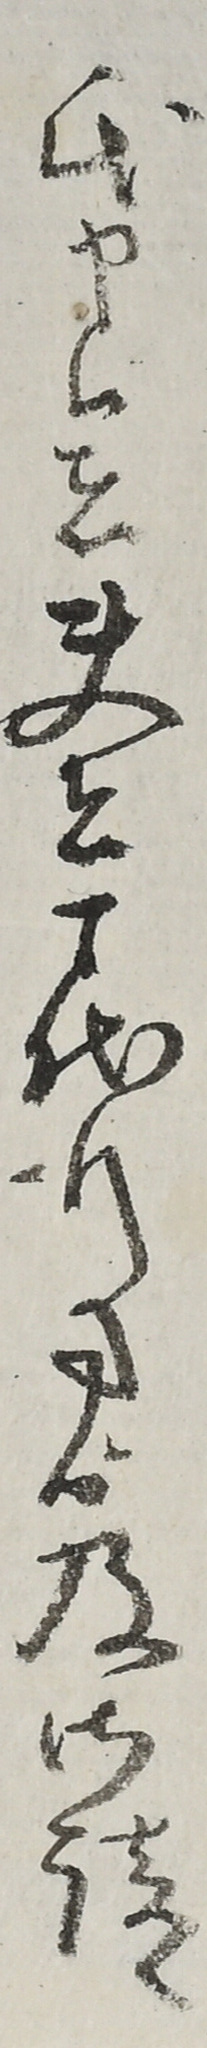氏申候者夫者丁代行司ゟ及御談候
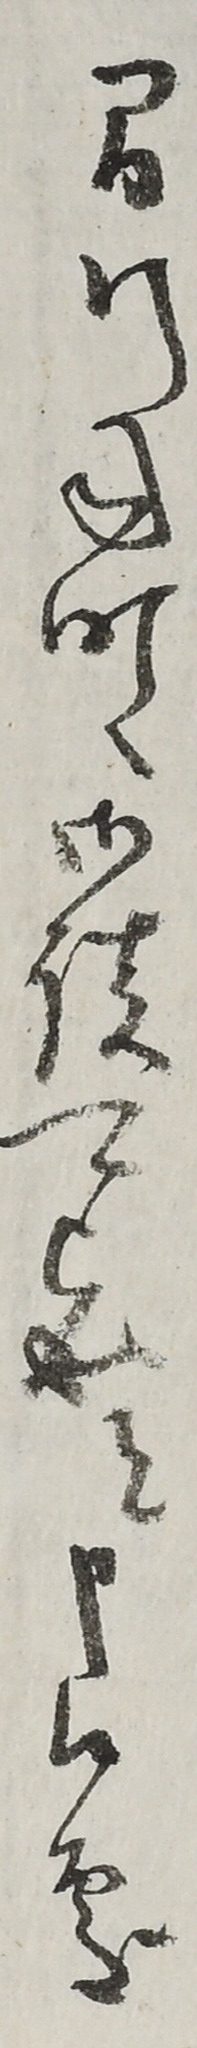間行司町へ御談可被成者申候処
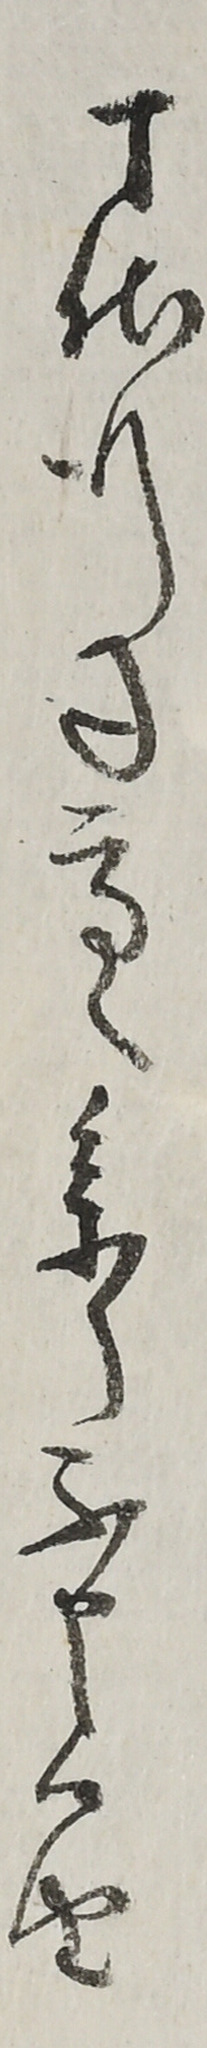丁代行司方へ参り不申候由
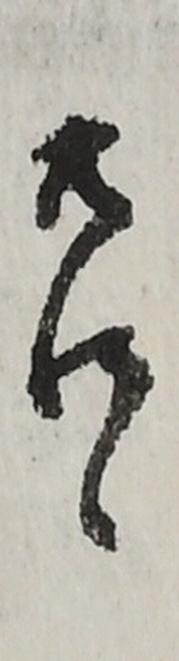廿四日
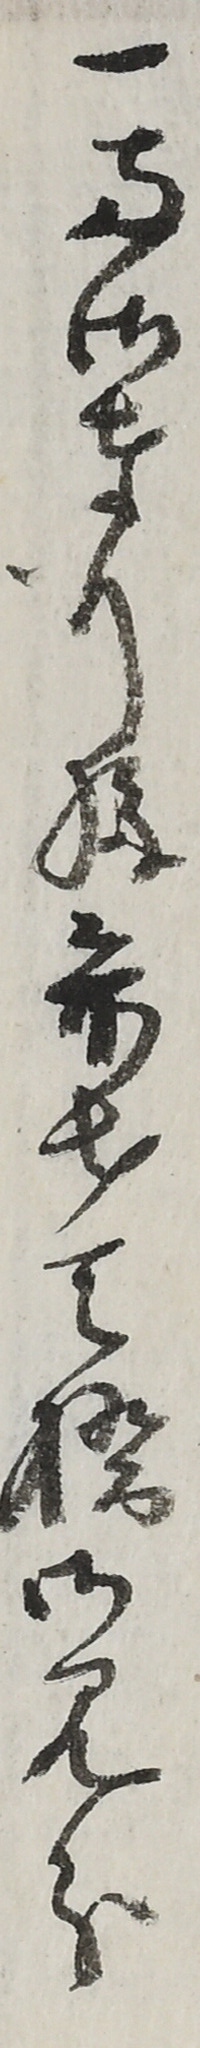一両御奉行様弁才天橋御見分
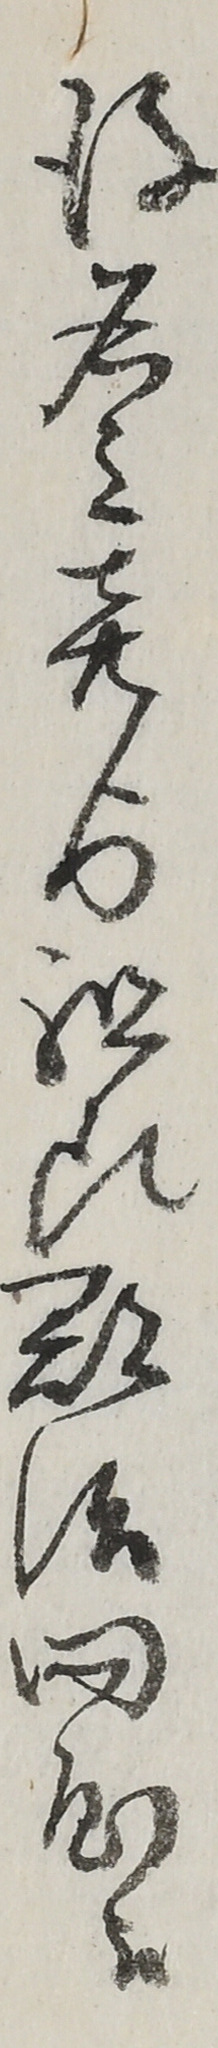後名主喜右衛門組頭郡治問屋江
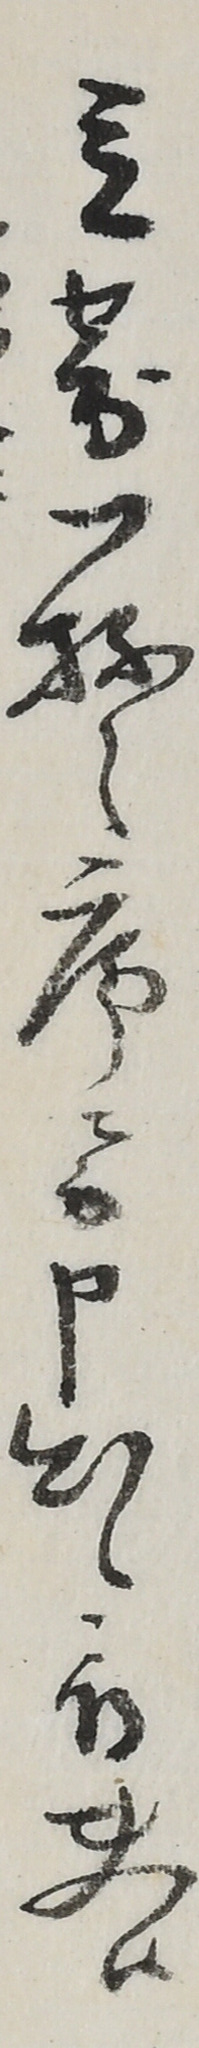立寄一杯之席ニ而申出候ニ付夫候
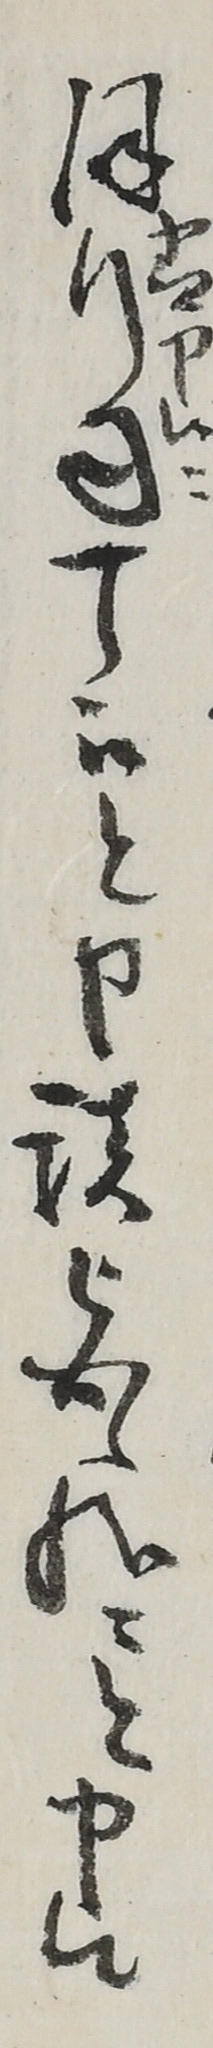月番申候ニ行司丁江と申談被成候様ニと申候
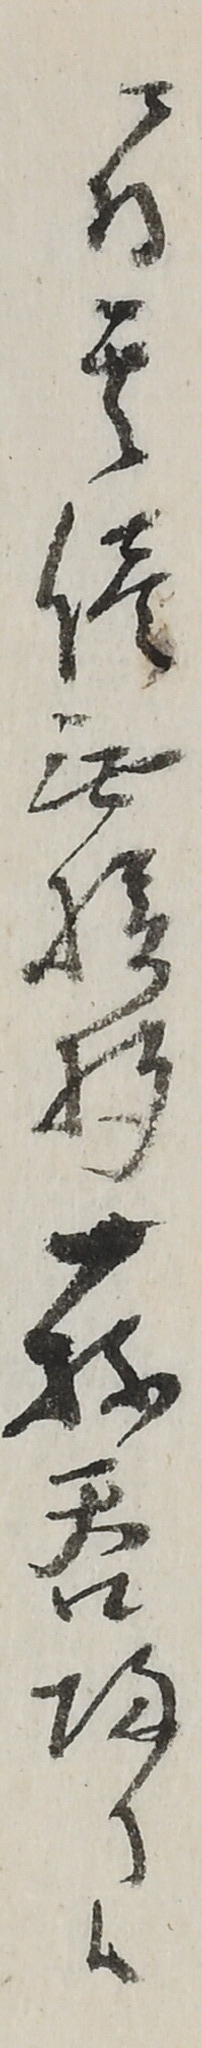ニ付其侭無挨拶一杯呑帰り候
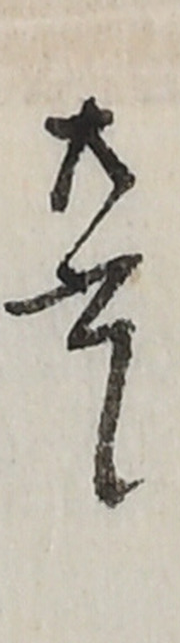廿六日
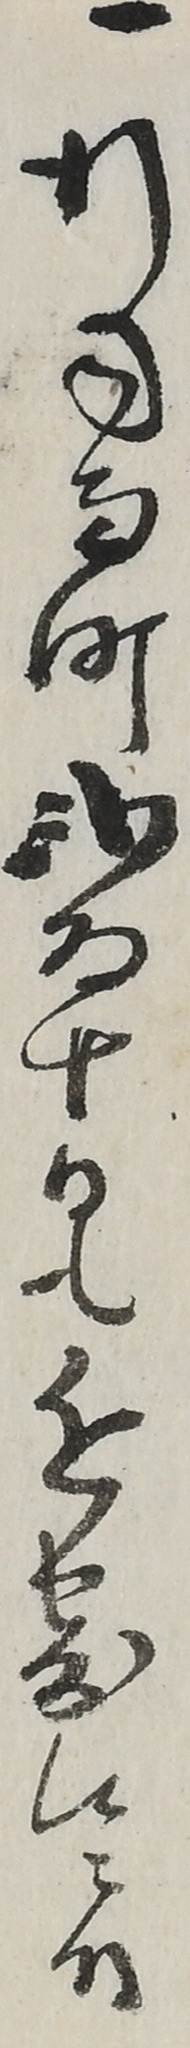一行司両町弐百十日も近寄候ニ付
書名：鉾持村風祭登山に付掛合の次第
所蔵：伊那市立高遠町図書館・合同会社AMANE
